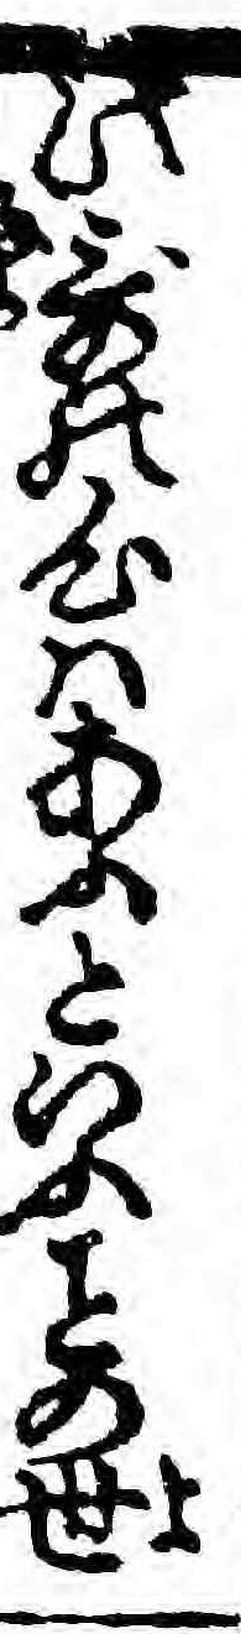此哥の心はあふといふことの世
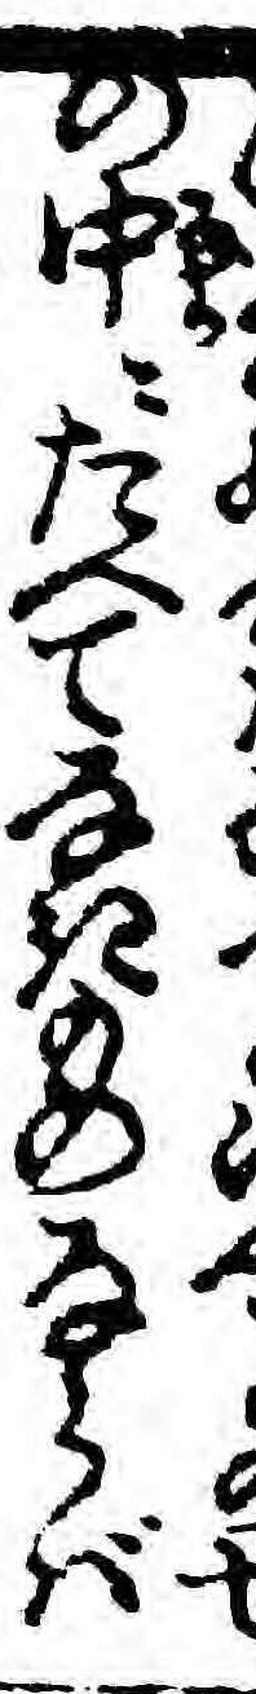の中にたへてなきものならば
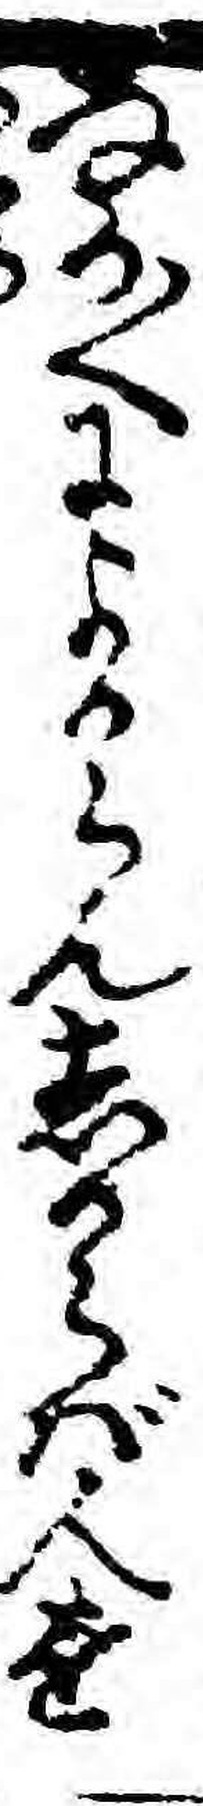なか〳〵によからんしからば人を
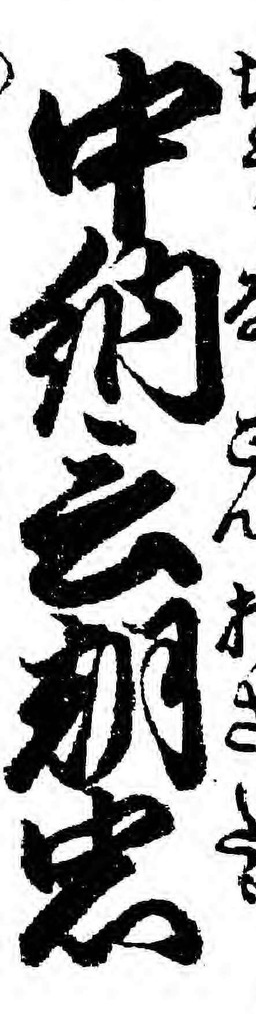中納言朝忠
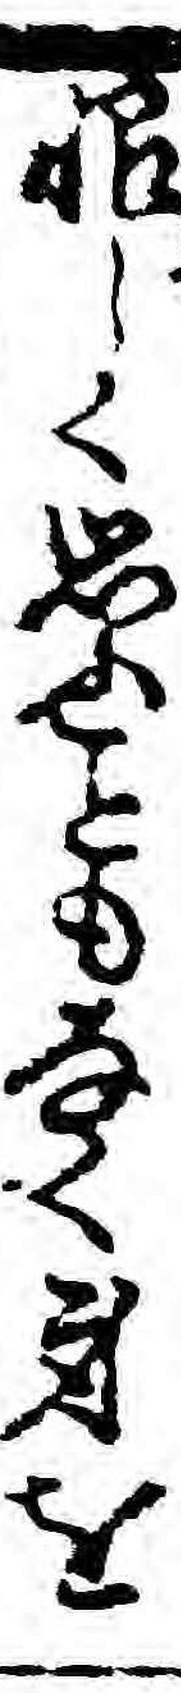恨しく思ふこともなく身を
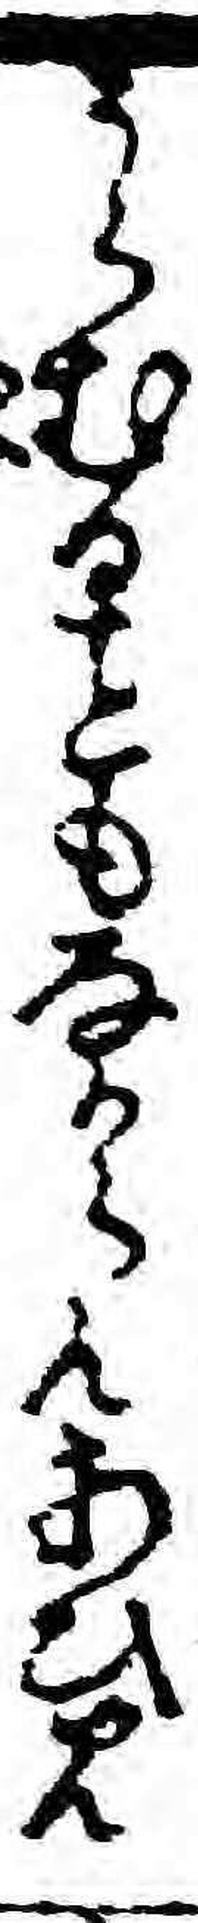うらむることもなからんあひ見
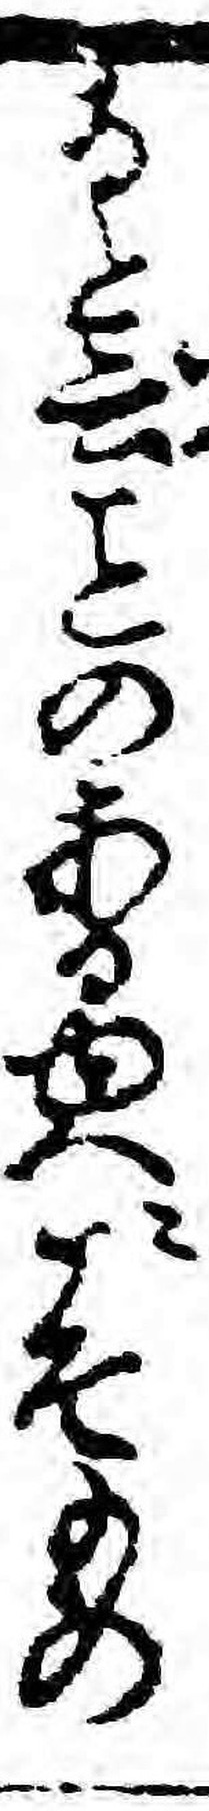ると云ことのあるゆへにてこそもの
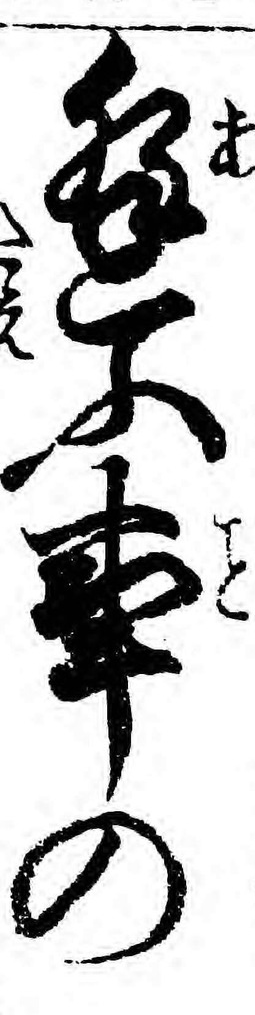逢ふ事の
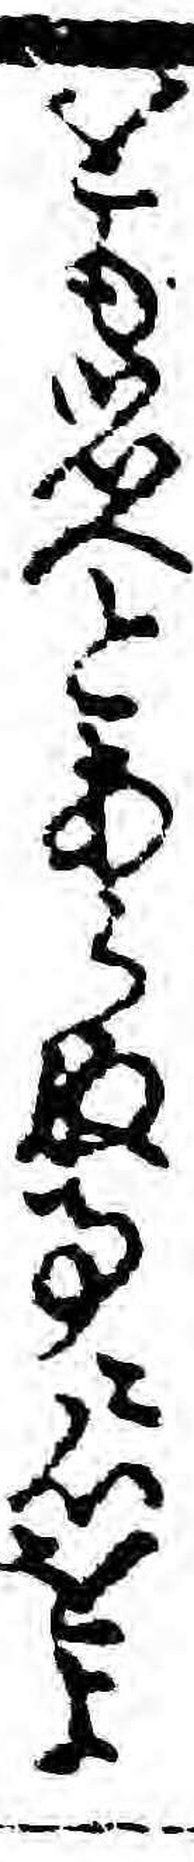をも思へとあらぬるに心をよ
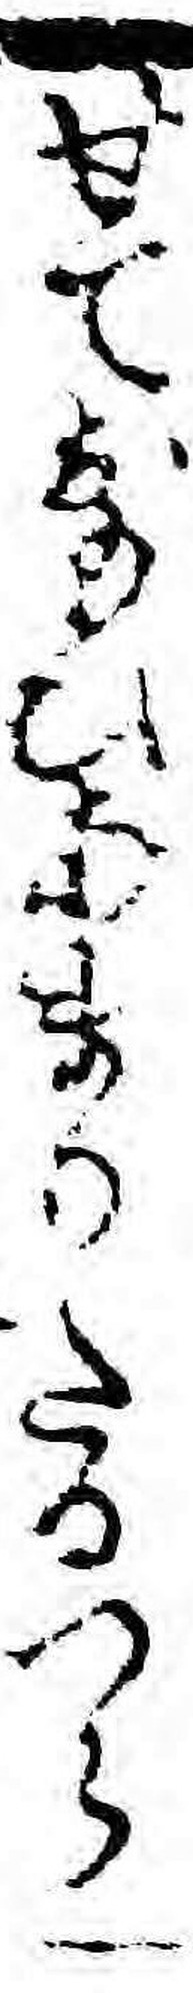せておもひあまりたるつら
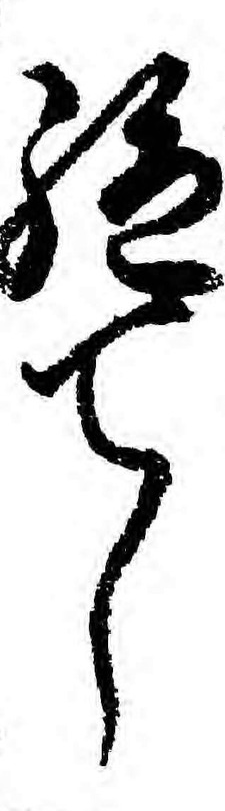絶てし
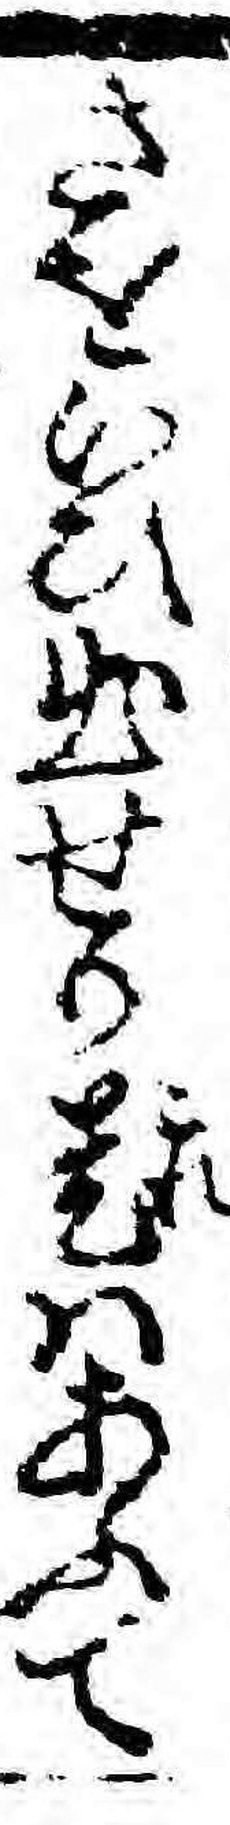さをいひ出せり是はあふて
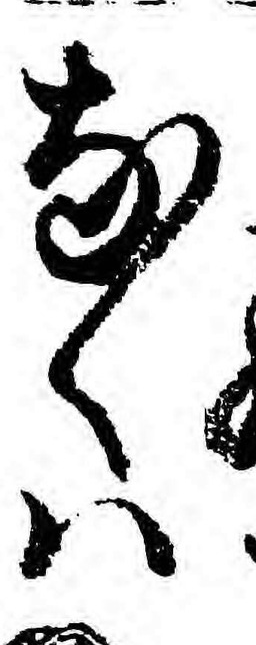なくは
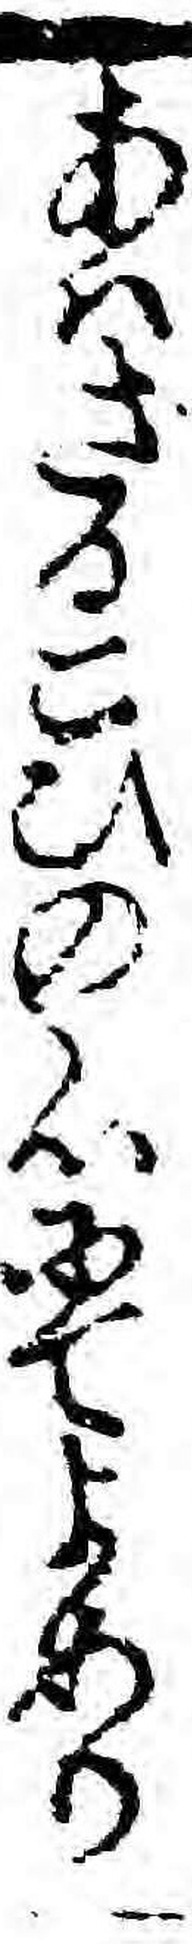あはざるこひの心にてよめり
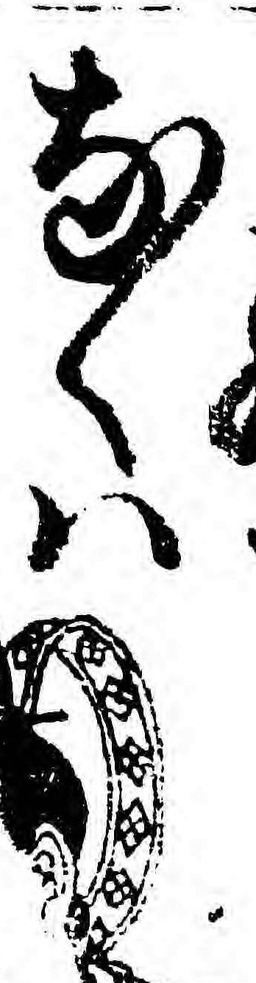なくは
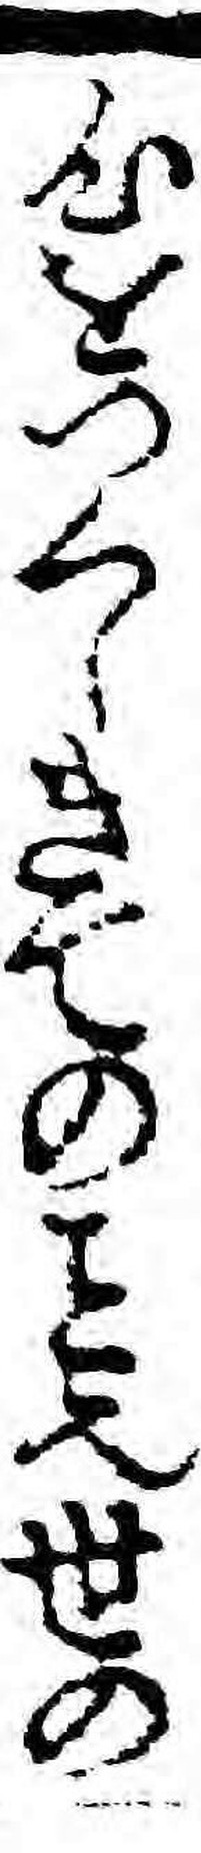心をつくしきてのこと也世の
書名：頭書和歌注譯／壽賀多百人一首小倉錦
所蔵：国文学研究資料館
